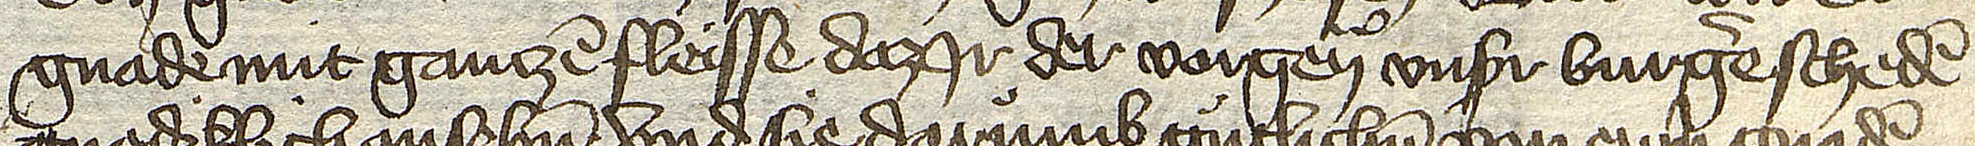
gnade mit gancʒe* fleiſſe daʒ Ir der vorgen* vnſ*r burge* ſchede*
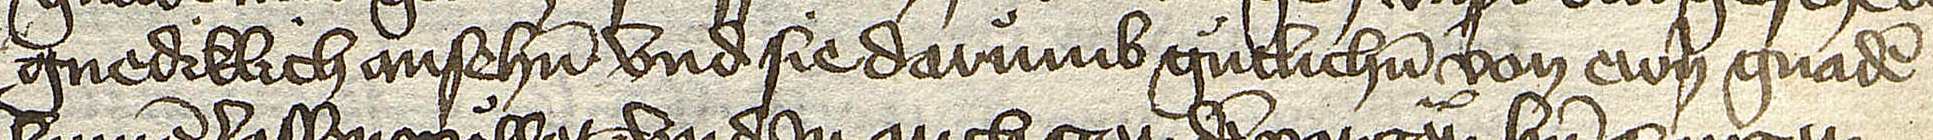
gnediklich anſehn* vnd ſie darümb gütlichn* von ew*n gnade*
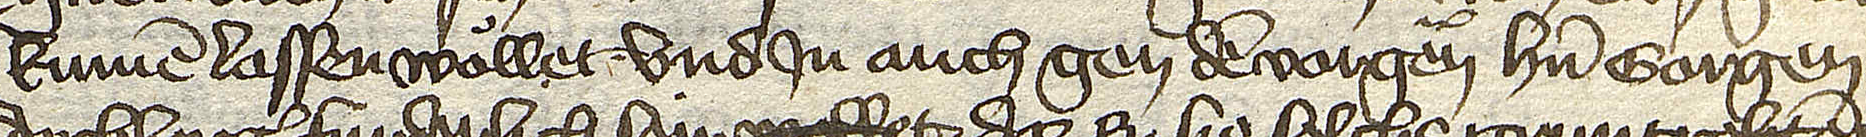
kume* laſſen wöllet . vnd In auch gen de* vorgen* hn* Gorgen
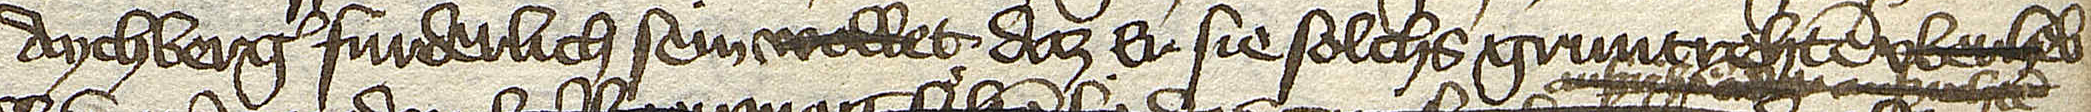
Aychberg* fürderlich ſein wollet daʒ Er ſie ſolchs gruntrehte* v̈berheb
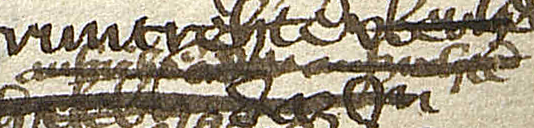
auſʒrihte* oder auſʒrihte*
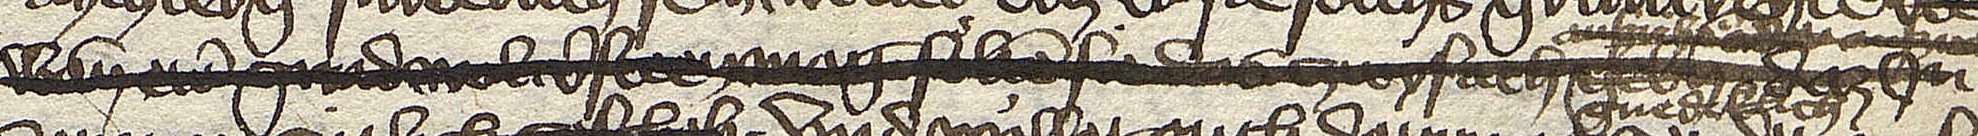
wan* ew* gnad wol v*ſteen mag ſölte* ſie das cʒur ſach gebn* daʒ In
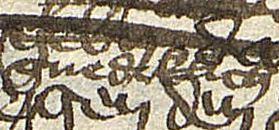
gnediklich
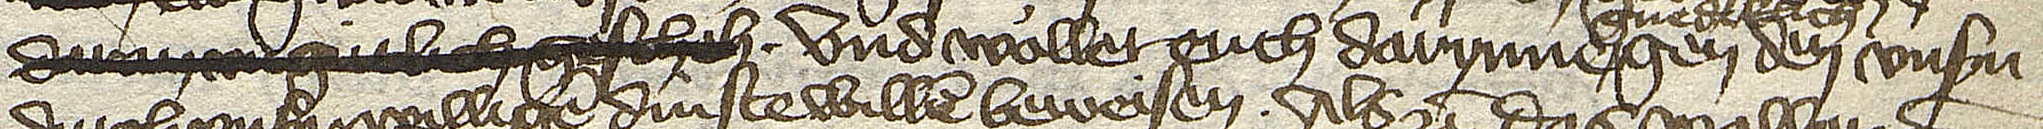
daran vngütlich geſcheh . vnd wöllet euch darynne gen den vnſ*n
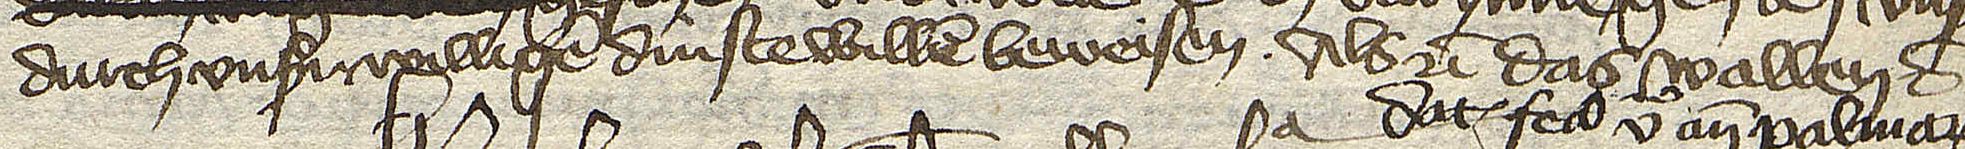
durch vnſ*n willige* dinſte wille* beweiſen . Als ec* Das wollen ec*
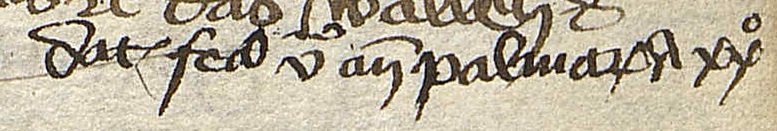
Dat* fea* v* an* palma* A* xx*
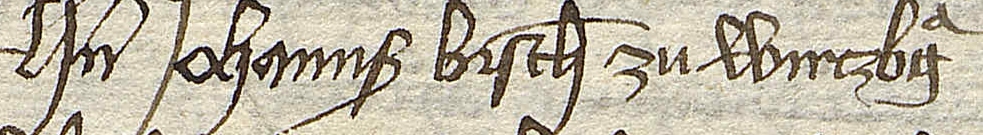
Hn* Iohannſ* biſch* ʒu Wircʒb*g
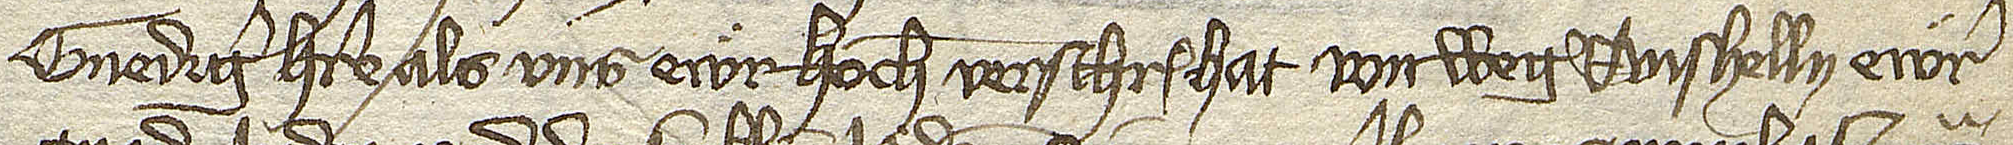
Gnedig* h*re als vns eẅr hoch* verſchr* hat von weg* Anſhelln eẅr*
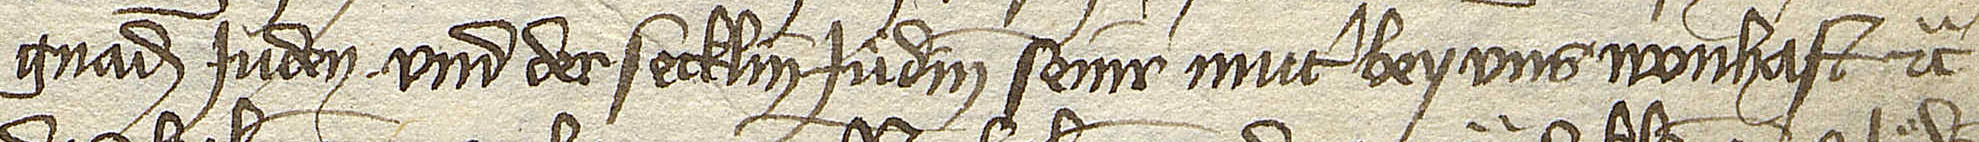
gnad* Iuden . vnd der ſecklin Iüdin* ſeinr mut* bey vns wonhaft ec*
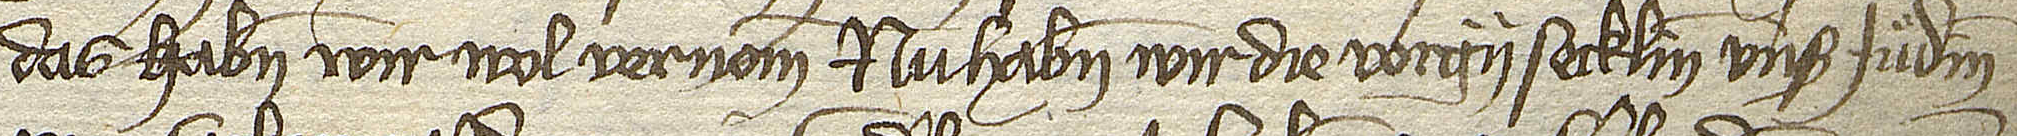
das habn* wir wol vernom* Nu habn* wir die vorgn* ſecklin* vnſ* Iüdin*
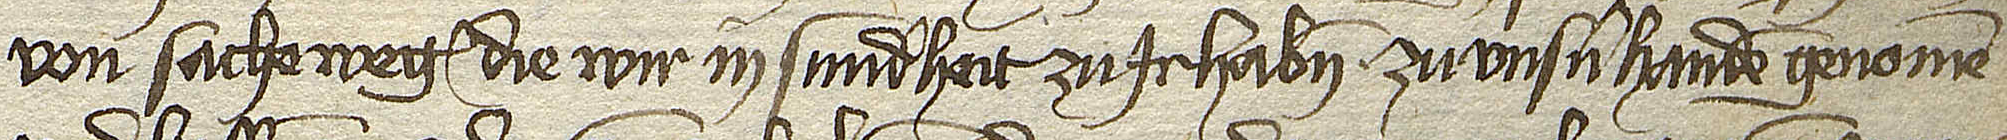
von ſache weg* die wir in ſund*heit ʒu Ir habn* . ʒu vnſn* hande* genome*
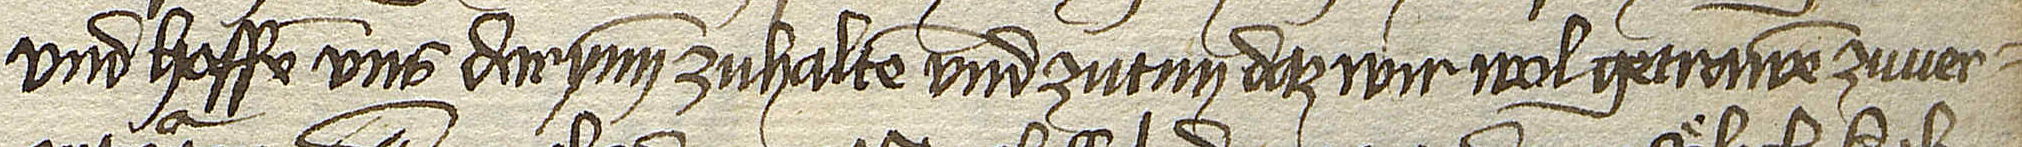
vnd hoffe* vns darynn* ʒuhalte* vnd ʒutun daʒ wir wol getrawe* ʒuuer =
